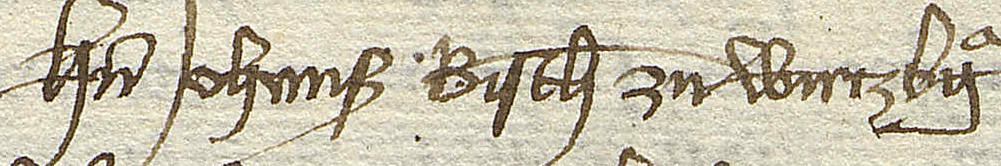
H*n Iohanſ* Biſch* ʒ Wircʒb*g
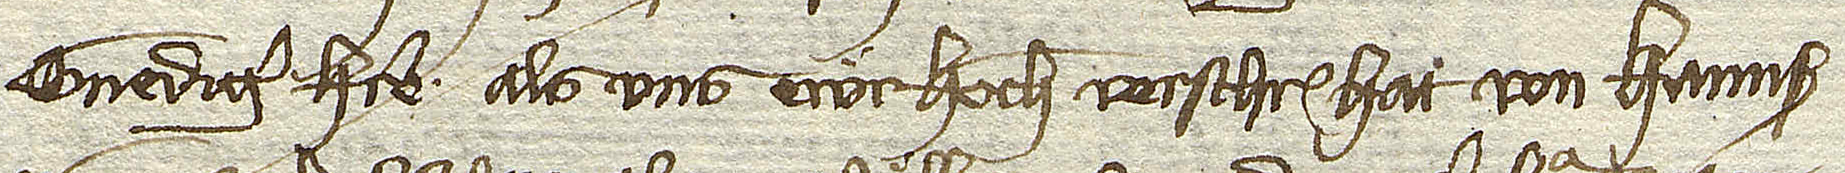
Gnedig* h*re . als vns ewr hoch* verſchr* hat von Hannſ*
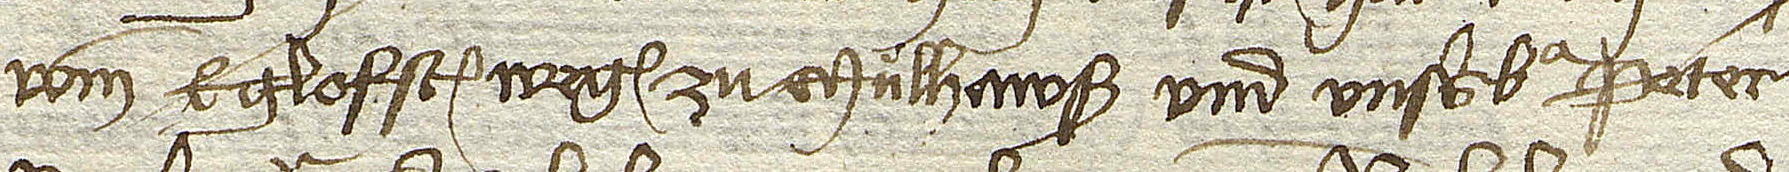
vom* Eglofſt* weg* ʒu Mülhawſ* vnd vnſ*s b* Peter
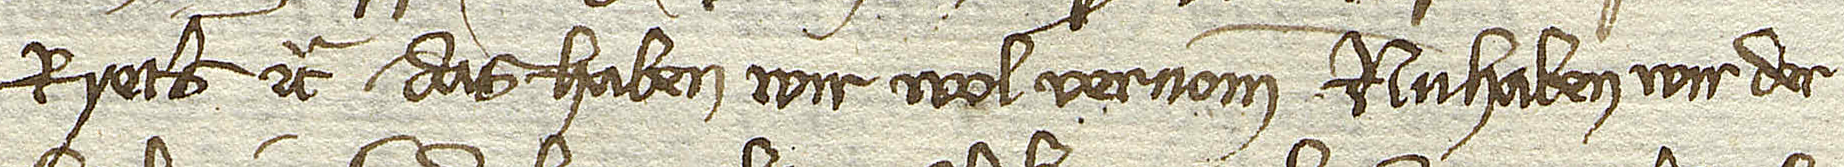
Ryets* ec* / das haben wir wol vernom* . Nu haben wir der
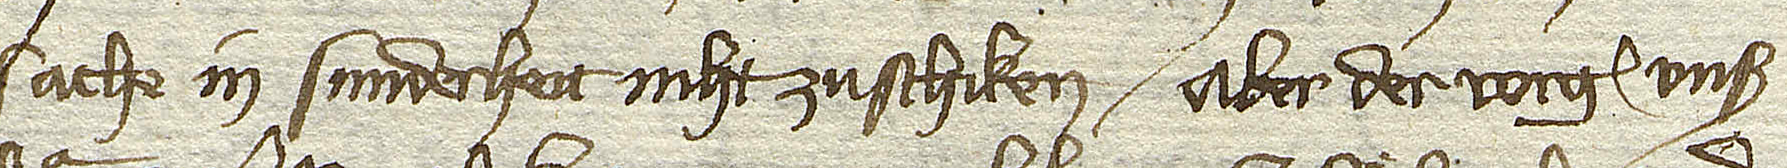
ſache in ſunderheit niht ʒu ſchiken / Aber der vorg* vnſ*
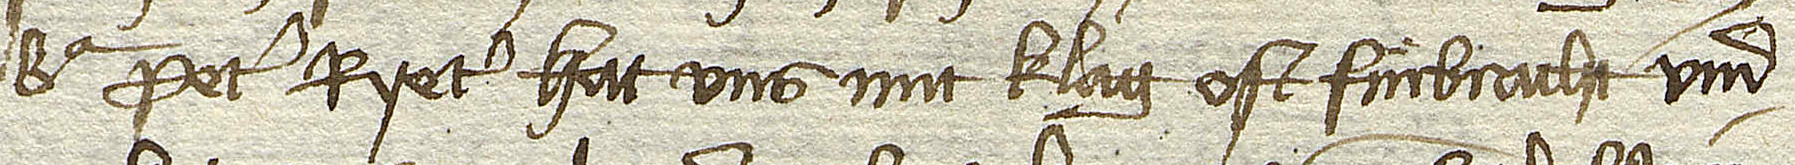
b* Pet* Ryet* hat vns mit klag oft fürbracht vnd
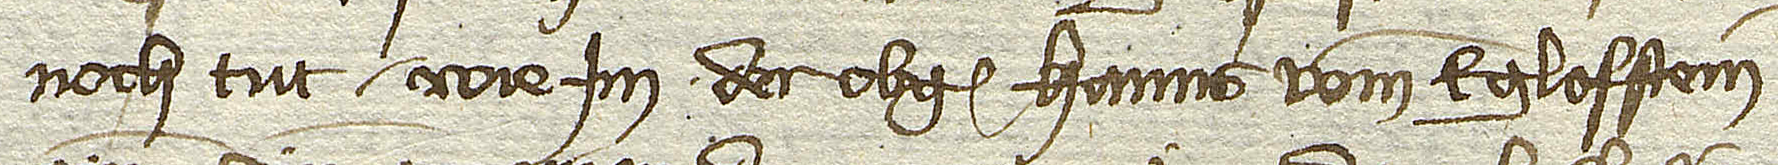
noch tut / wie Im . der obg* hanns vom* Eglofſtein
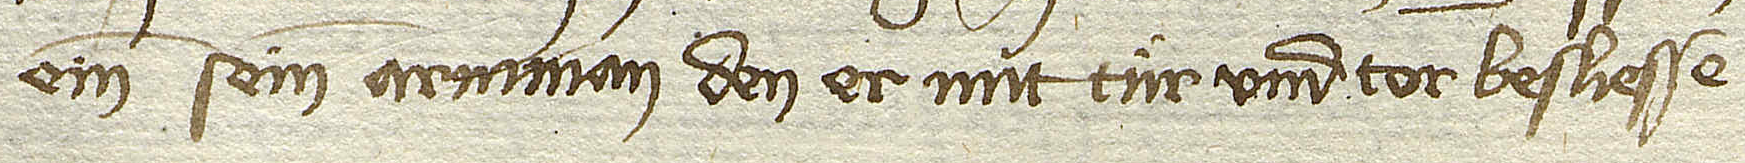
ein* ſein* armman den er mit tür vnd tor beſlieſſe
